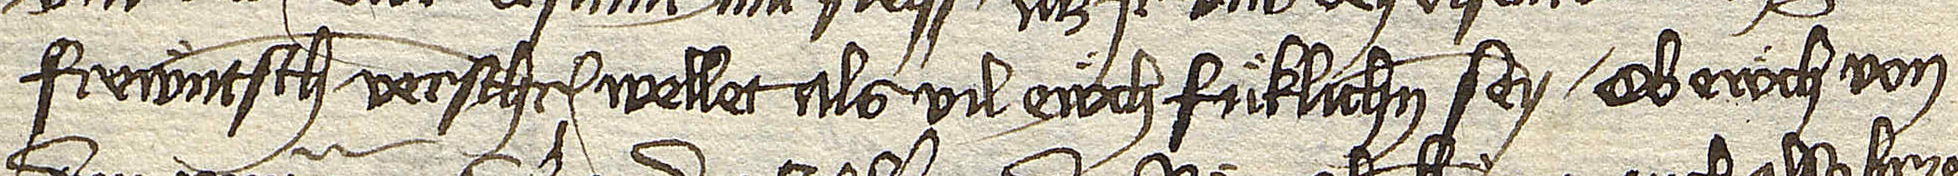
freẅntſch* verſchr* wellet als vil eẅch füklichn* ſey / Ob eẅch von
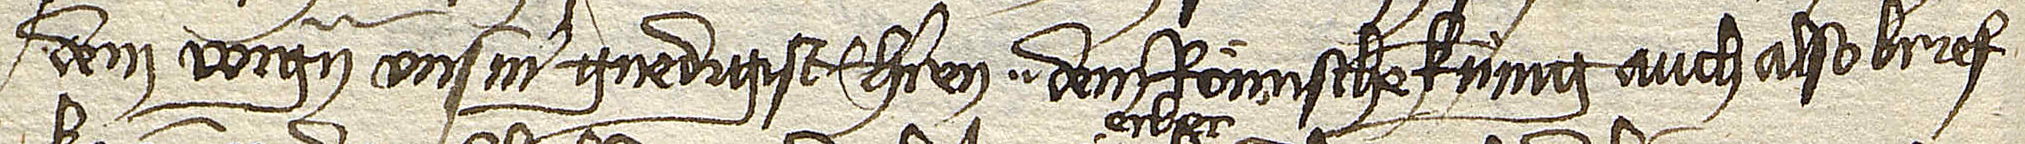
dem vorgn* vnſm* gnedigiſt* h*ren ~ dem Römiſche* künig auch alſo brief
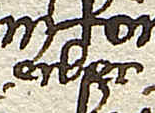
erber
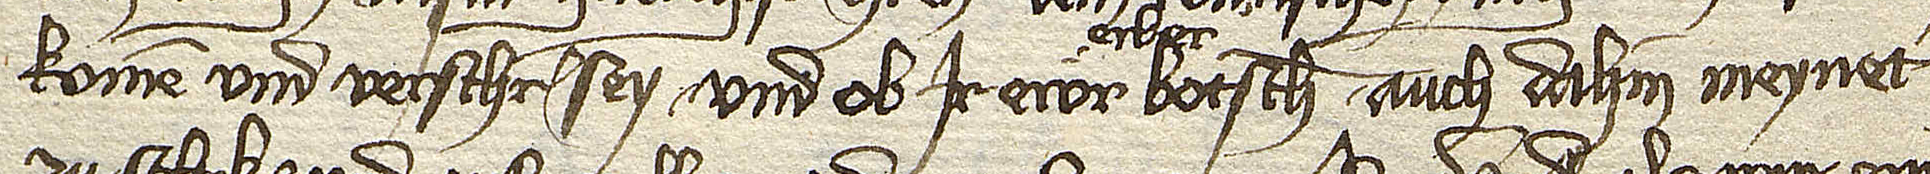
kome* vnd verſchr* ſey / vnd ob Ir eẅr botſch* / auch dahin meynet
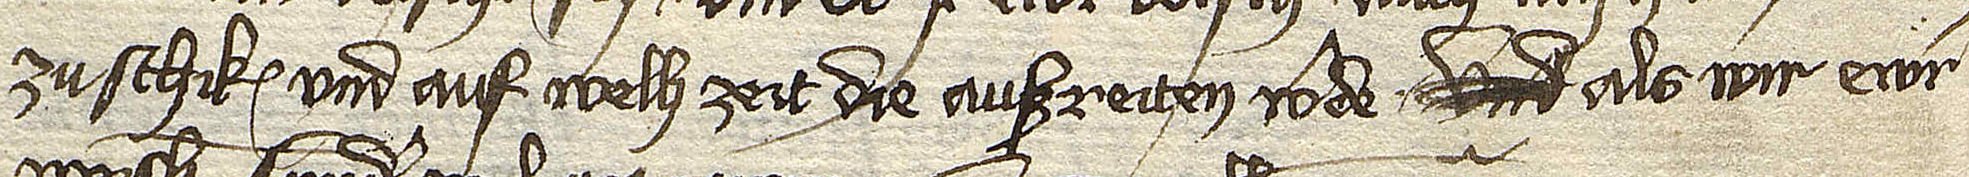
ʒu ſchik* vnd auf welh ʒeit die auſʒreiten w*de . / Vnd als wir eẅr*
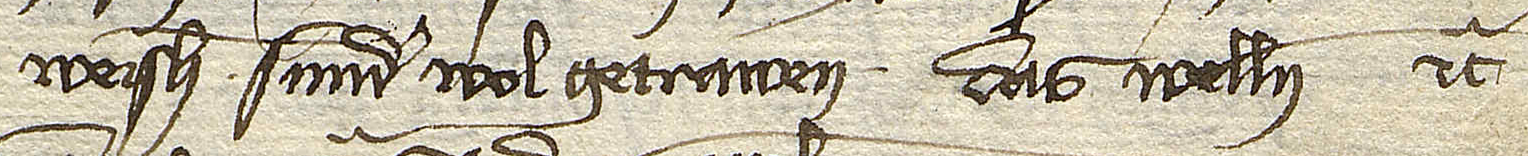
weiſh* . ſund* wol getrawen . Das welln* ec*
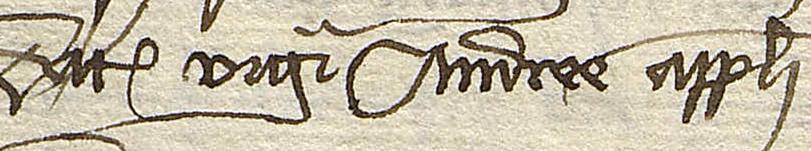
Dat* vigi* Andree* appli*
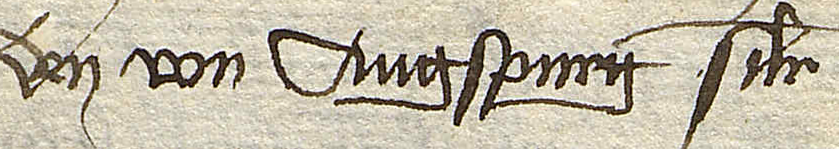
Den von Augſpurg ſilr*
